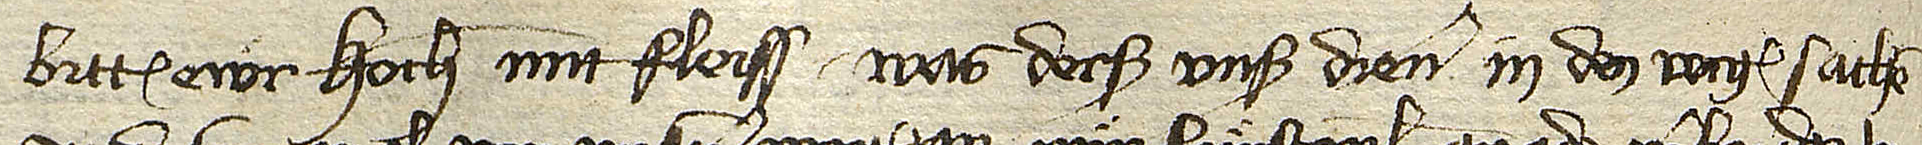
bitt* ewr hoch* mit fleiſſ / was derſ* vnſ* dien* in den vorg* ſache*
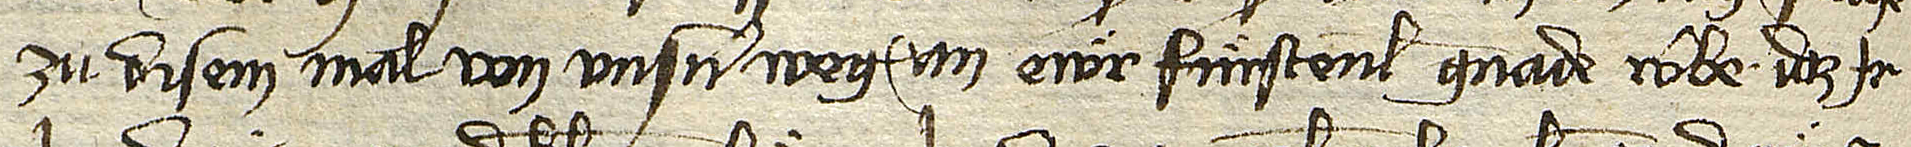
ʒu diſem mal von vnſn* weg* an ewr fürſtenl* gnade w*be . daʒ Ir
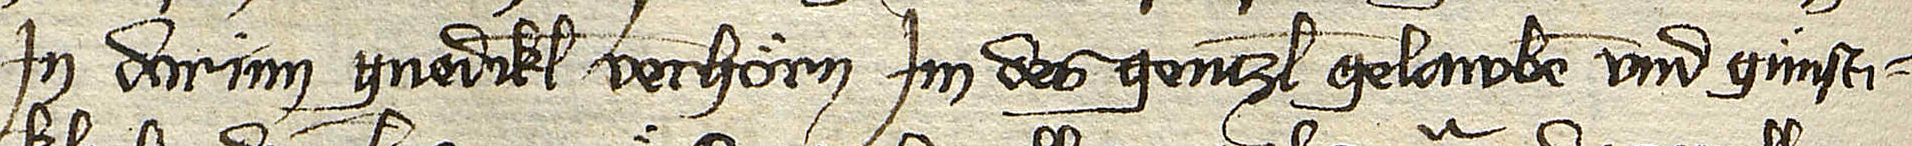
In darinn gnedigkl* verhörn Im des gencʒl* gelawbe* vnd günſti =
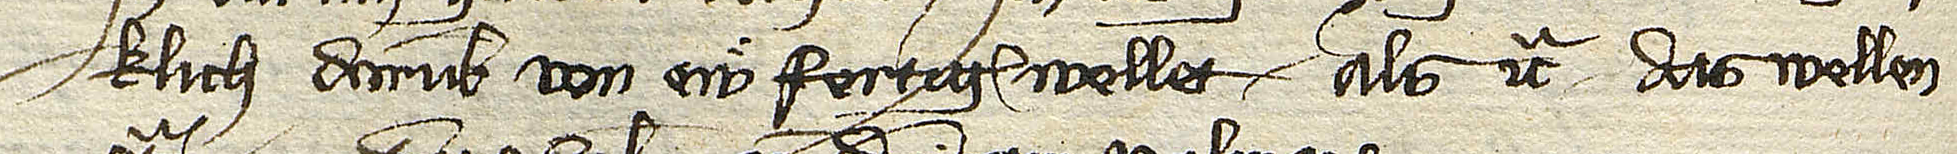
klich daru*b von ew fertig* wellet / als ec* das wellen
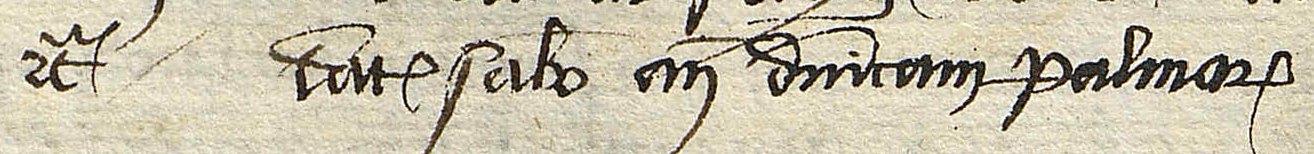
ec* / Dat* ſabo* an* dnicam Palma*
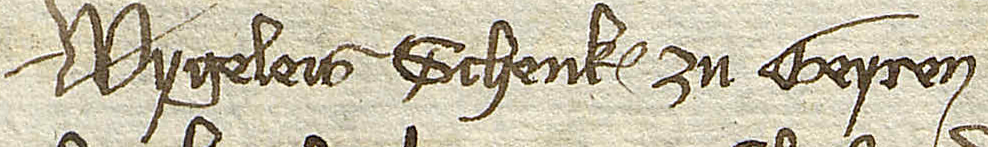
Wygeleis Schenk* ʒu Geyren
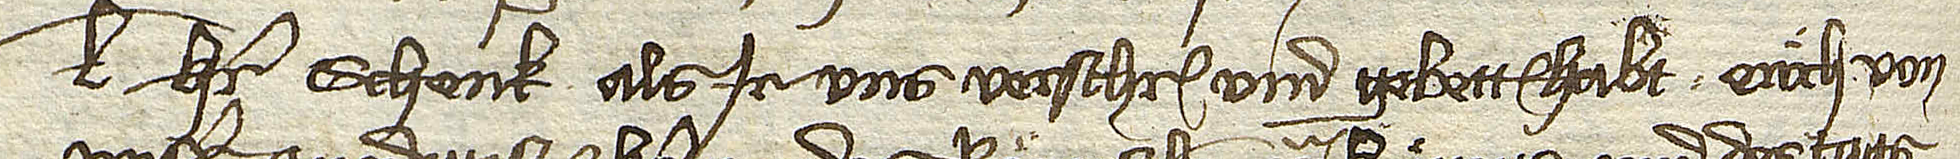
L* hr* Schenk als Ir vns verſchr* vnd gebett* habt . ewch von
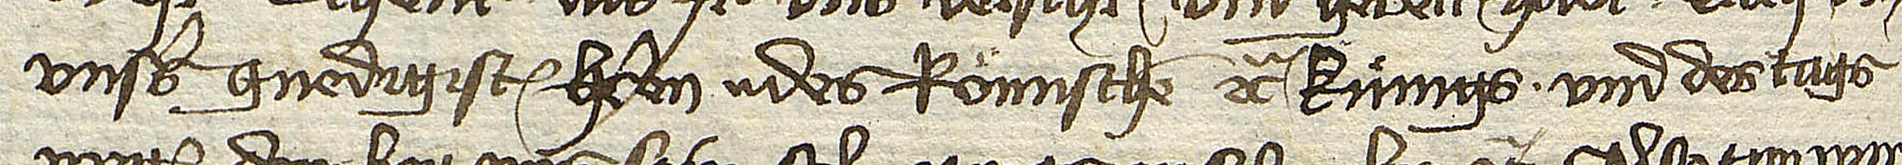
vnſ*s gnedigiſt* h*ren ~ des Römiſche* ec* künigs . vnd des tags
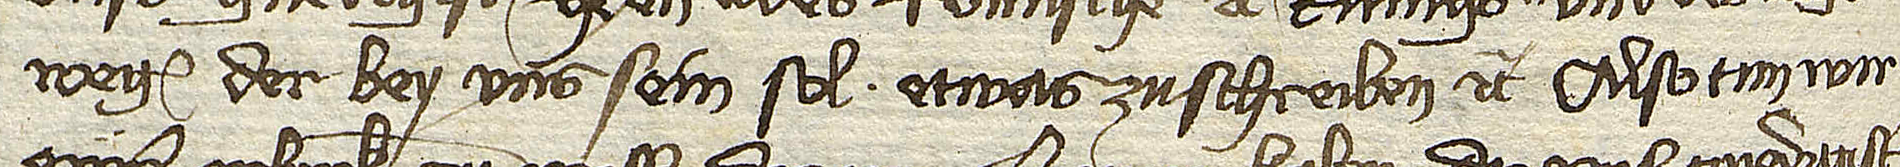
weg* der bey vns ſein ſol . etwas ʒu ſchreiben ec* Alſo tun wir
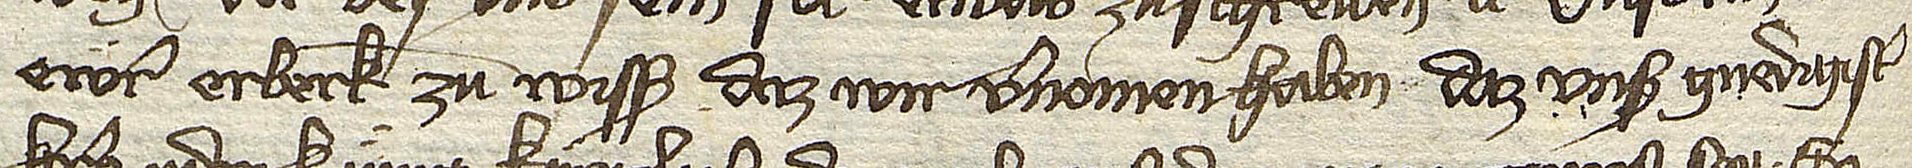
ewr* erberk* ʒu wiſſ* daʒ wir v*nomen haben daʒ vnſ* gnedigiſt*
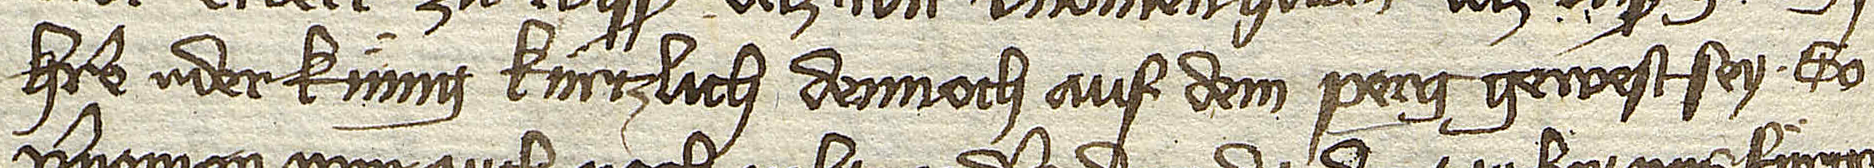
h*re ~ der künig kürcʒlich dennoch auf dem perg geweſt ſey . So
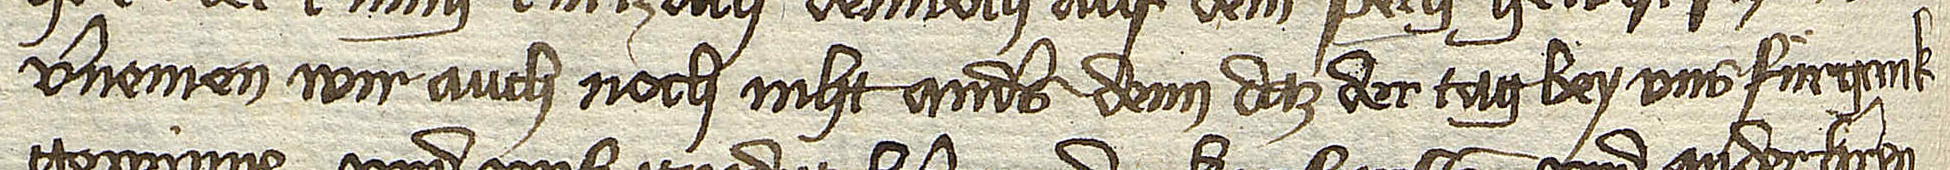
v*nemen wir auch noch niht and*s denn daʒ der tag bey vns fürgank
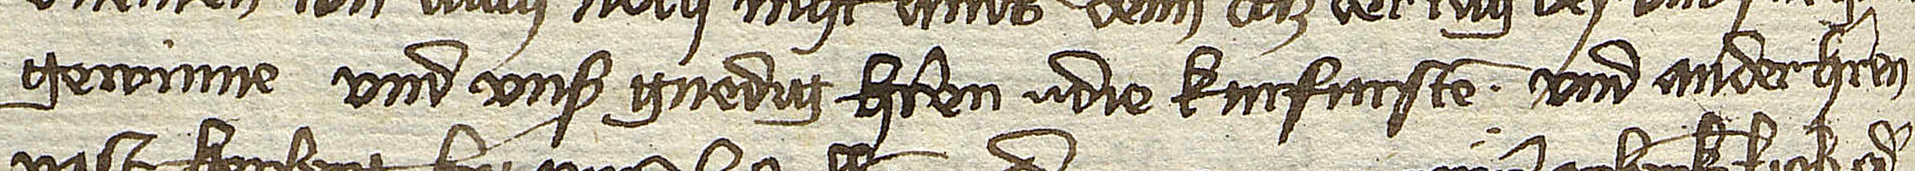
gewinne vnd vnſ* gnedig h*ren ~ die kurfurſte* . vnd ander h*ren
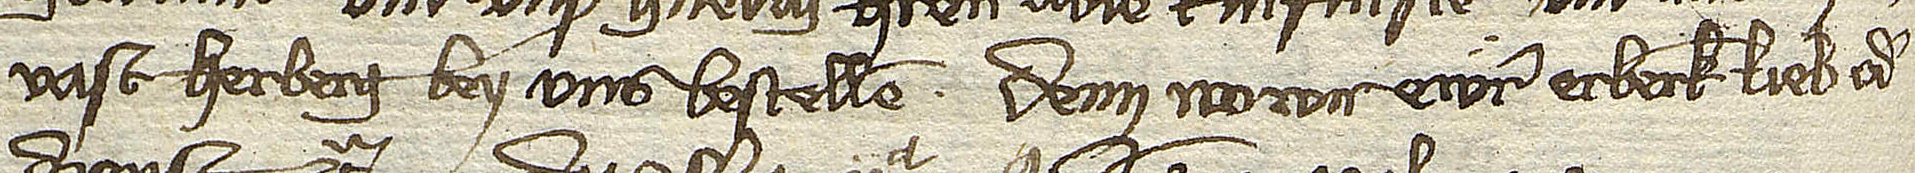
vaſt herberg bey vns beſtelle* . Denn wo wir ewr* erberk* lieb od*
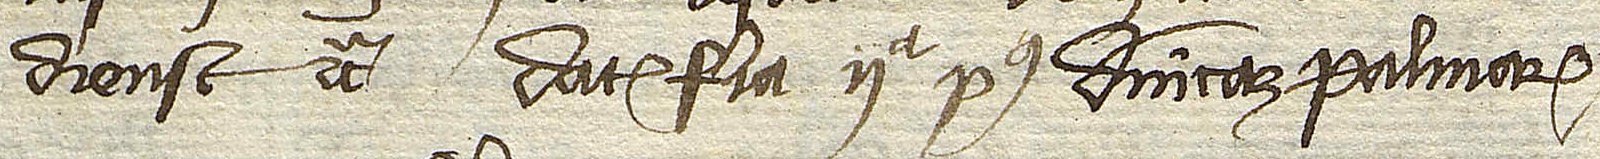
dienſt ec* Dat* f*ia ii* p* Dnica* Palma*
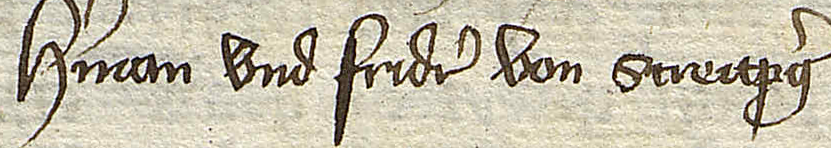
H*man vnd fridr* von Streitpg*
